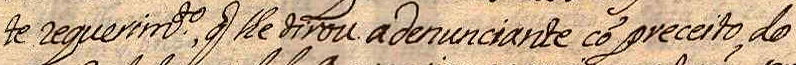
te requerim.to, q̄ lhe tirou a denunciante cō preceito do
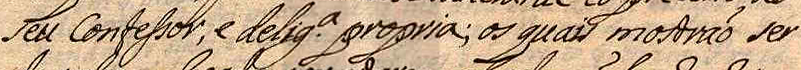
seu confessor, e delig.a propria; os quais mostraõ ser
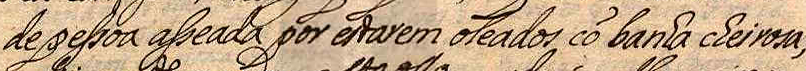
de pessoa asseada por estarem oleados co̅ banha cheirosa,
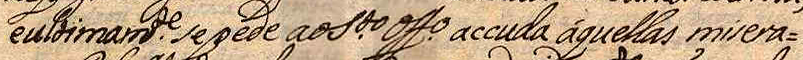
e ultimamte. se pede ao S.to Off.o accuda áquellas misera
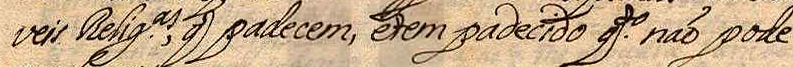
veis Relig.as, q̄ padecem, e tem padecido q.to naõ pode
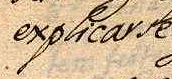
explicarse.
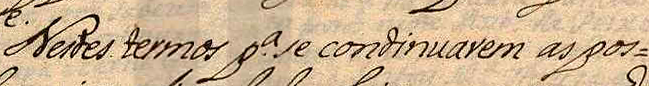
Nestes termos p.a se continuarem as pos
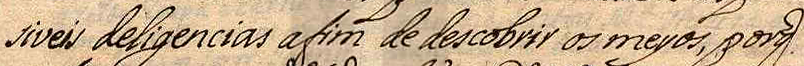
siveis deligencias a fim de descobrir os meyos, porq̄
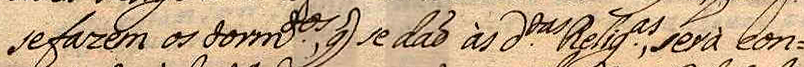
se fazem os torm.tos, q̄ se daõ às d.tas Relig.as, serà con
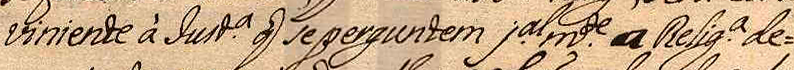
viniente à Iust.a q̄ se perguntem j.alm.te a Relig.a de
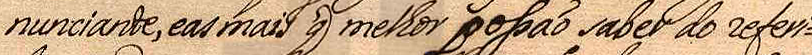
nunciante, e as mais q̄ melhor possaõ saber do referi
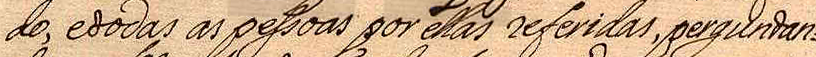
do, e todas as pessoas por ellas referidas, perguntan
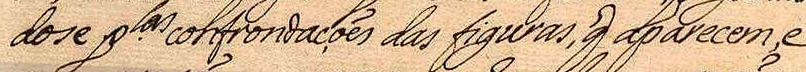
dose p.las confrontaçoẽs das figuras, q̄ aparecem, e
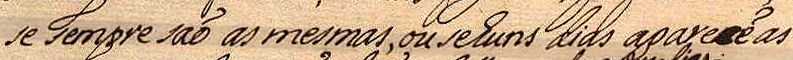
se sempre saõ as mesmas, ou se huns dias aparecē as
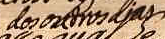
dos outros dias
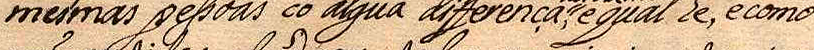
mesmas pessoas cō algūa differença; e qual he, e como
